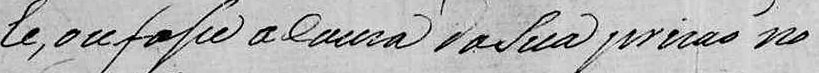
he, ou fosce a causa da sua prisaõ no
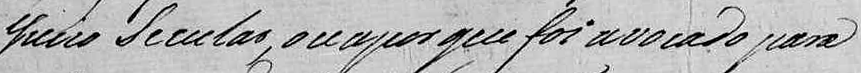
Juiso Secular, ou após que foi avocado para
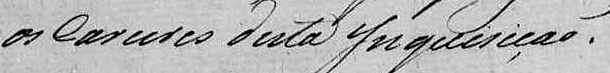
os Carceres desta Inquisiçaõ.
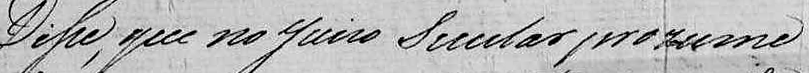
Disse, que no Juiso Secular prozume
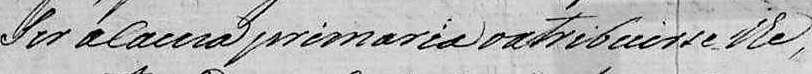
ser a causa primaria o atribuir-se-lhe,
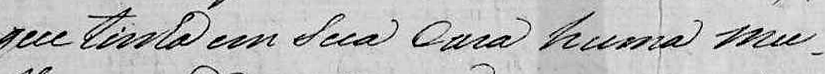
que tinha em sua casa huma mu
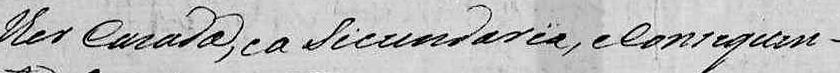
lher casada, e a Sicundaria, e consequen
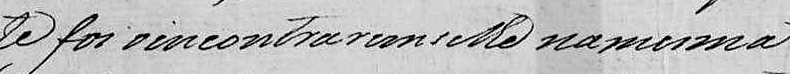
te foi o incontrarem-se-lhe na mesma
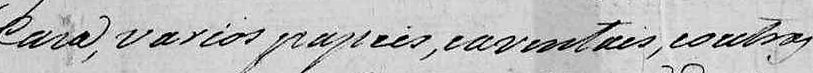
Casa, varios papeis, e aventais, e outras
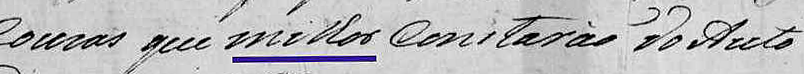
cousas que milhor constaraõ do Auto
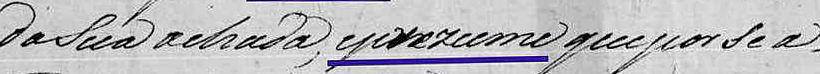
da sua achada, e prezume que por se a
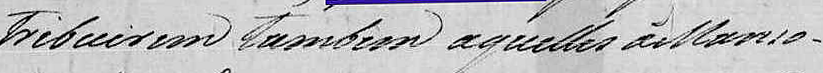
tribuirem tambem aquelles à Manso
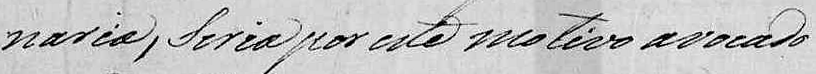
naria, seria por este motivo avocado
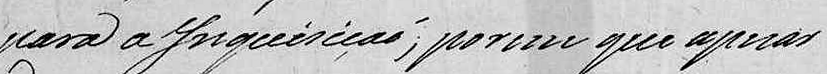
para a Inquisiçaõ, porem que apesar
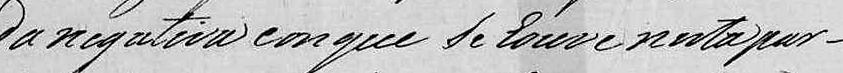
da negativa em que se houve nesta par
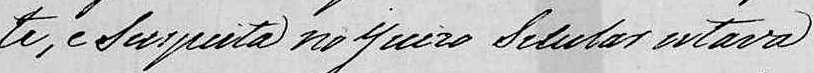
te, e suspeita no Juizo Secular estava
